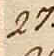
27.
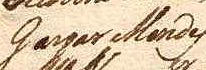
Gaspar Mendes
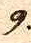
9.
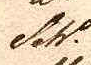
Setr.o
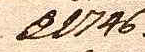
d̄ 1746.
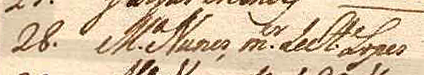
28. M.a Nunes, m.er de H.e Lopes
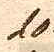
10.
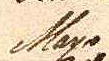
Mayo
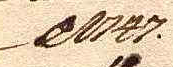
d̄ 1747.
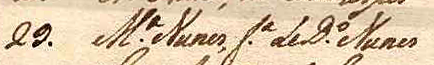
29. M.a Nunes, f.a de D.o Nunes
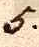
5.
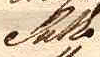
Iulho
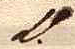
d.o
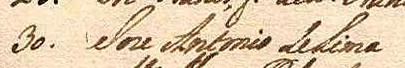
30. Ioze Antonio de Lima
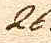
26.
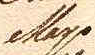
Mayo
